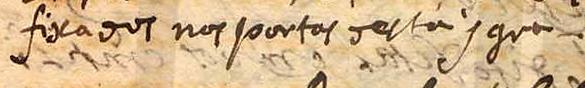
fixados nas portas desta jgra
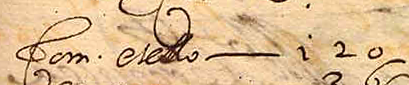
Com. e sello – i20
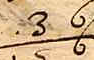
36
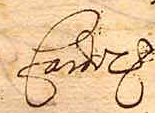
Cardozo
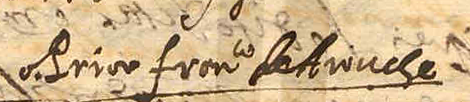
o Prior fran.co de Arouche
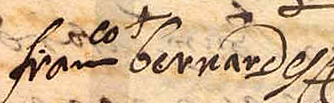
fran.co bernardes
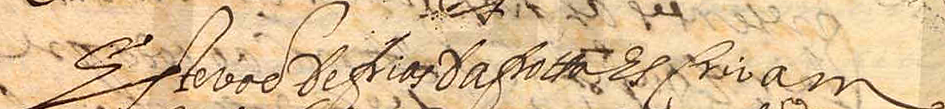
Estevaõ de frias da frotta Escrivam
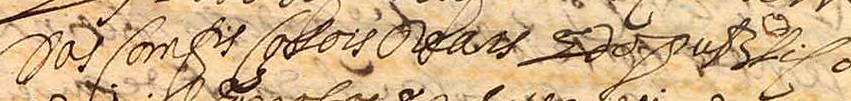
das ComfisCasois Reais E dopubliCo
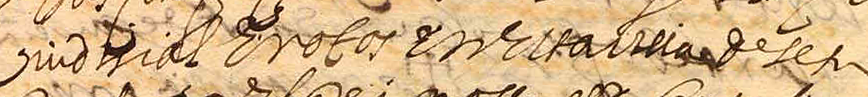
iudisial E notas E nesta villa de seu
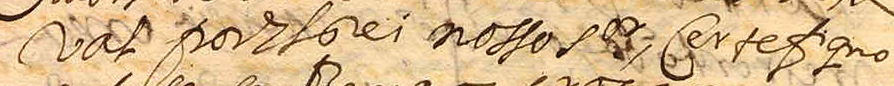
val por El Rei nosso s.or, Certefiquo
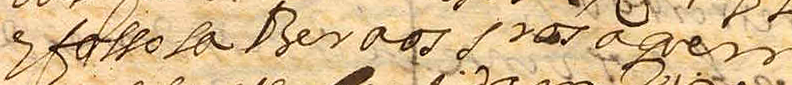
E fasso saber aos sr.os a quem
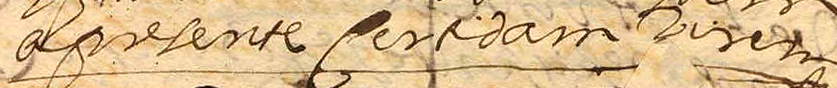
a presente Certidam virem
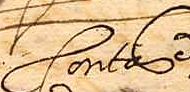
Contas
